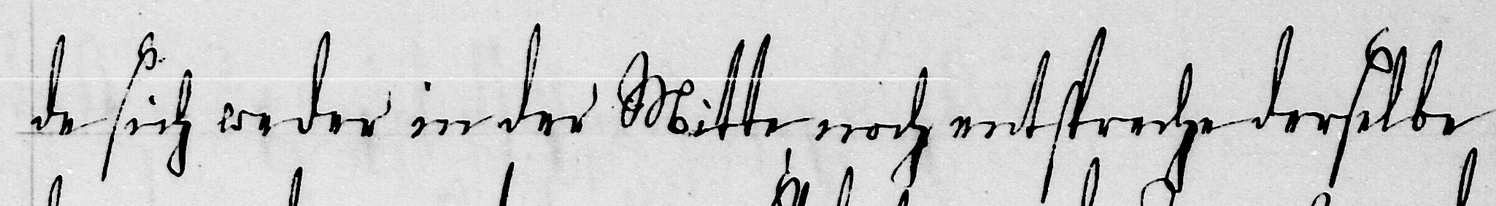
de sich weder in der Mitte, noch entspreche derselbe
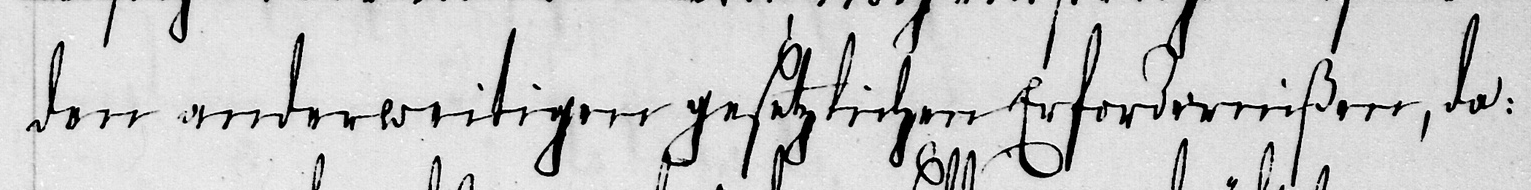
den anderweitigen gesetzlichen Erfordernißen, da:
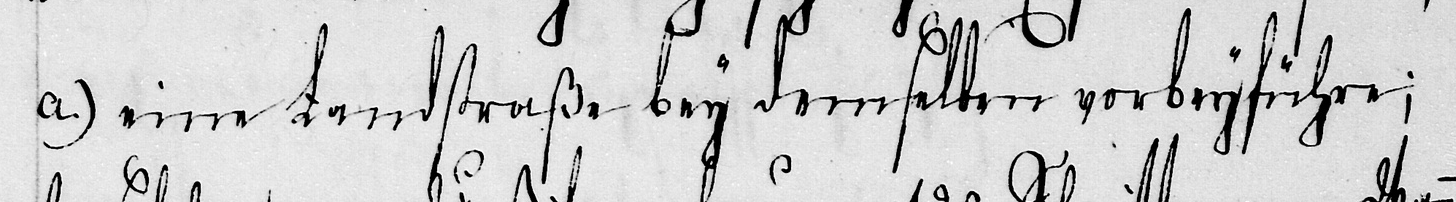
a.) eine Landstraße bey demselben vorbeyführe;
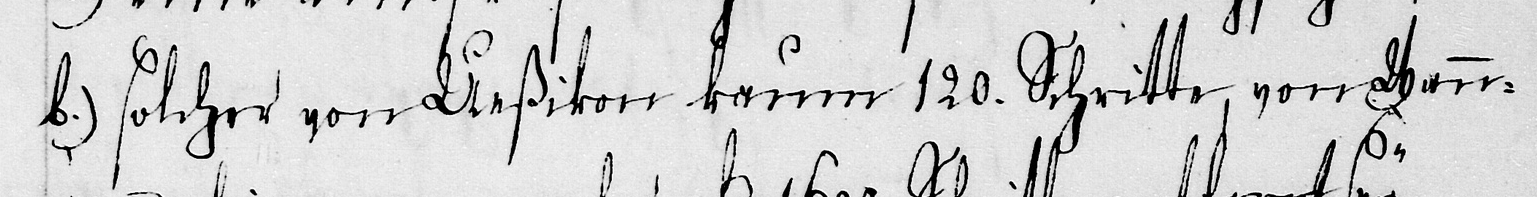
b.) solcher von Ueßikon kaum 120. Schritte, von Wann¬
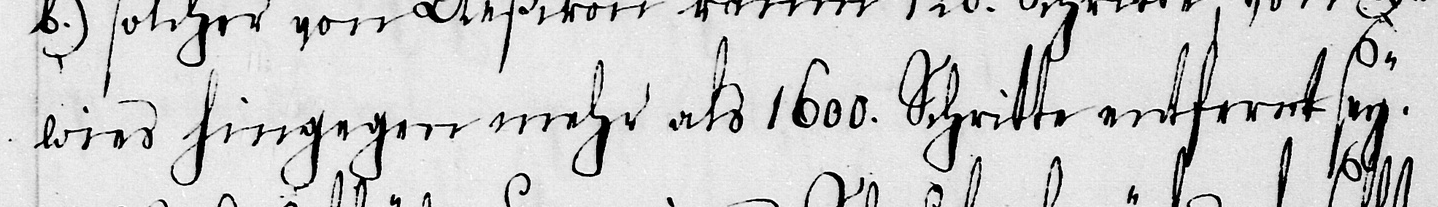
wies hingegen mehr als 1600. Schritte entfernt sey.
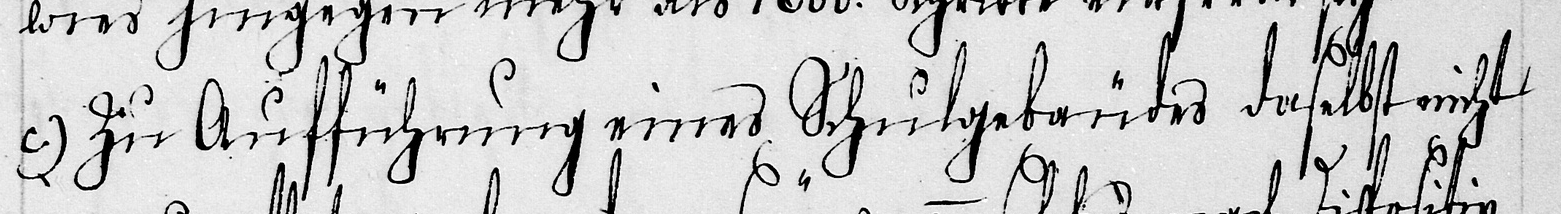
c.) Zu Aufführung eines Schulgebäudes daselbst nicht
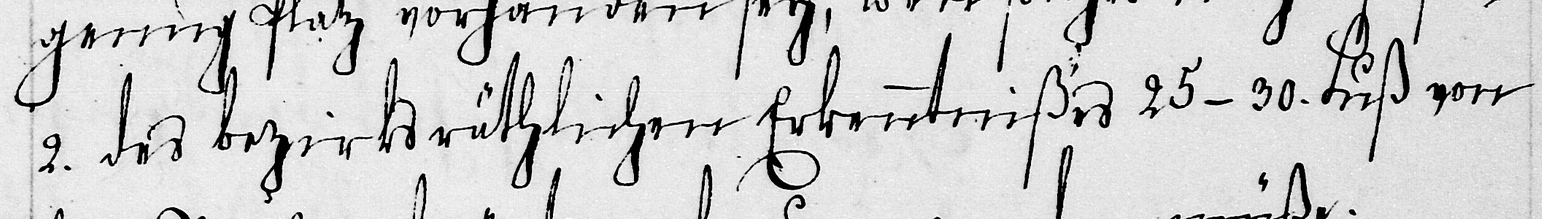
2. des bezirksräthlichen Erkenntnißes 25–30. Fuß von
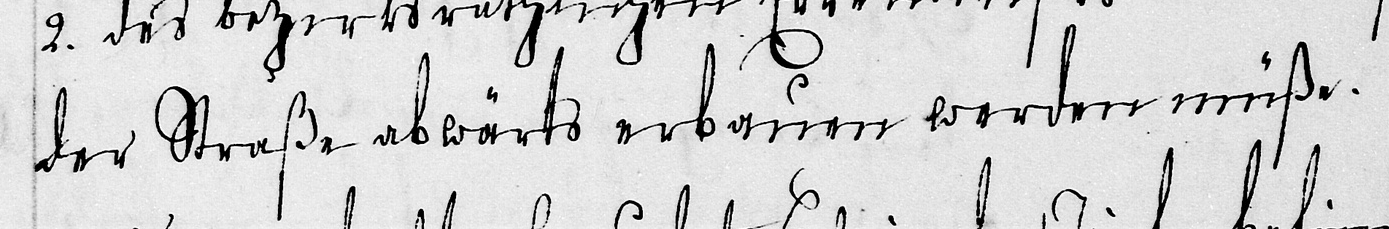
der Straße abwärts erbauen werden müße.
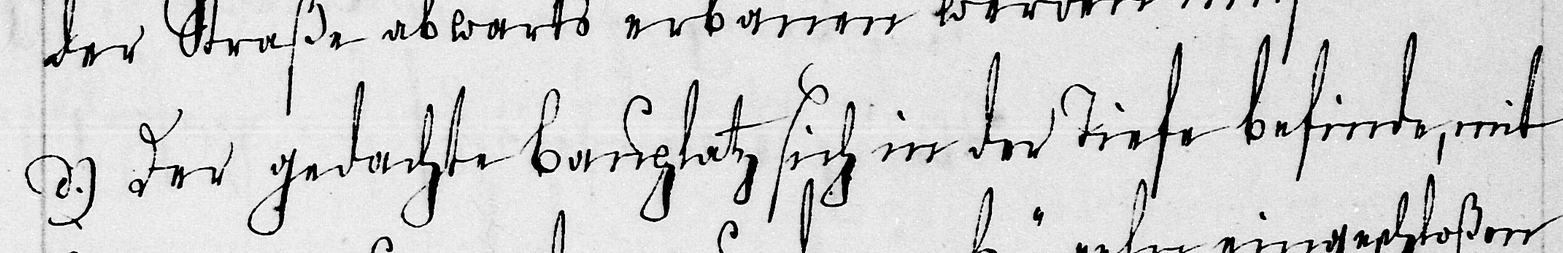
d.) Der gedachte Bauplatz sich in der Tiefe befinde,
